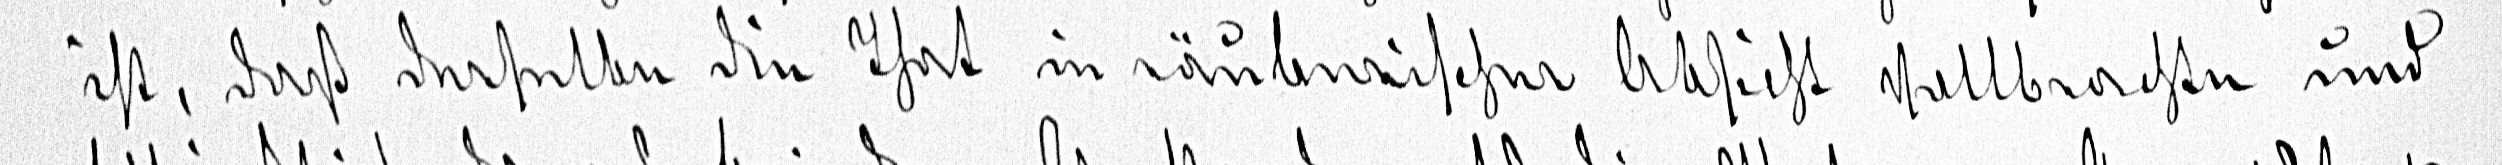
ist, daß derselbe die That in räuberischer Absicht vollbrachte und
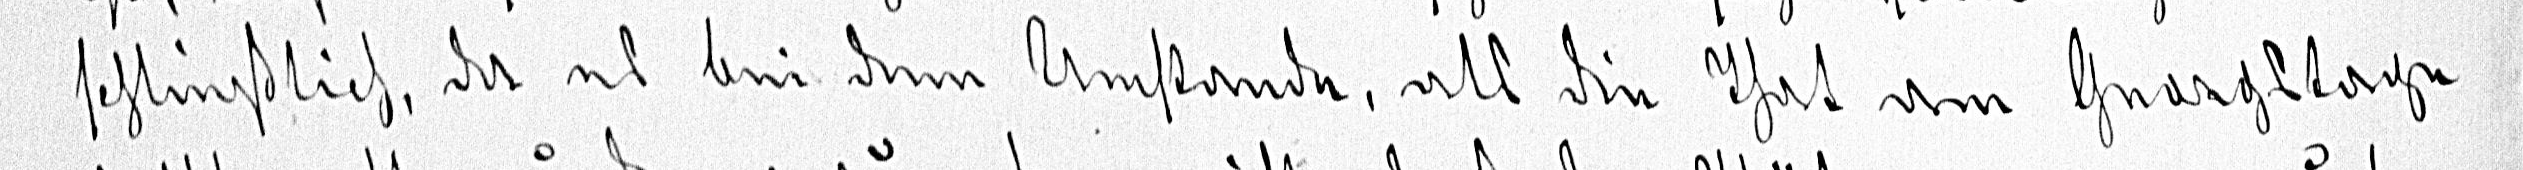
schließlich, da es bei dem Umstande, als die That am Georgstage
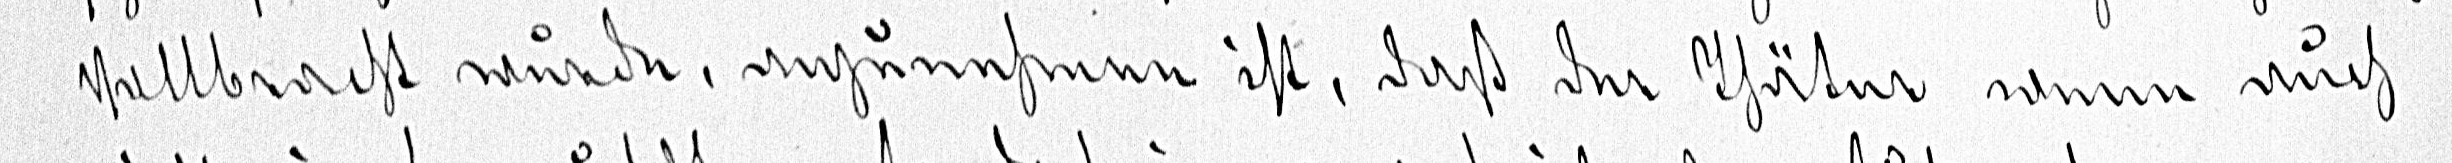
vollbracht wurde, anzunehmen ist, daß der Thäter wenn auch
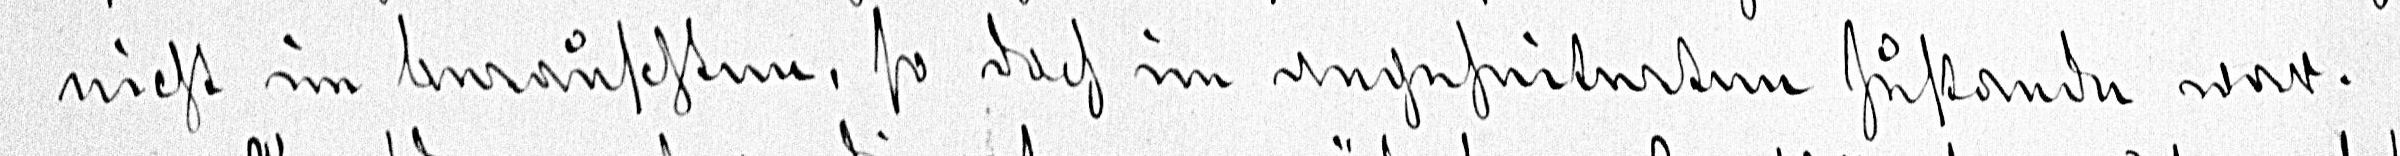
nicht im berauschten, so dach im angeheiterten Zustande war.
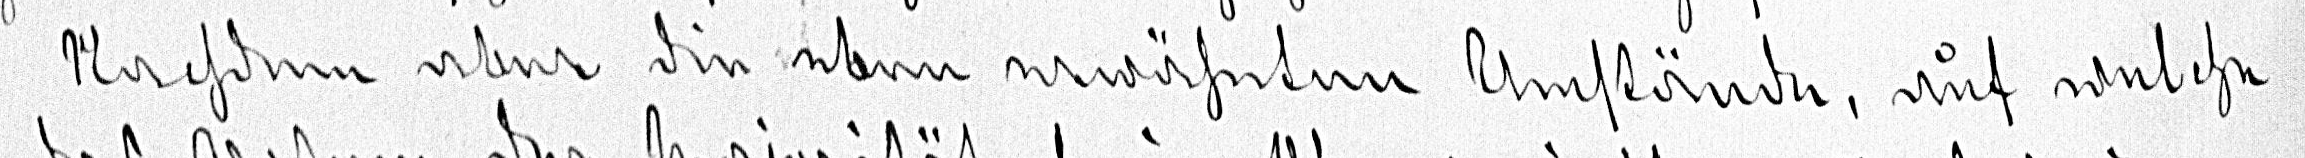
Nachdem aber die eben erwähnten Umstände, auf welche
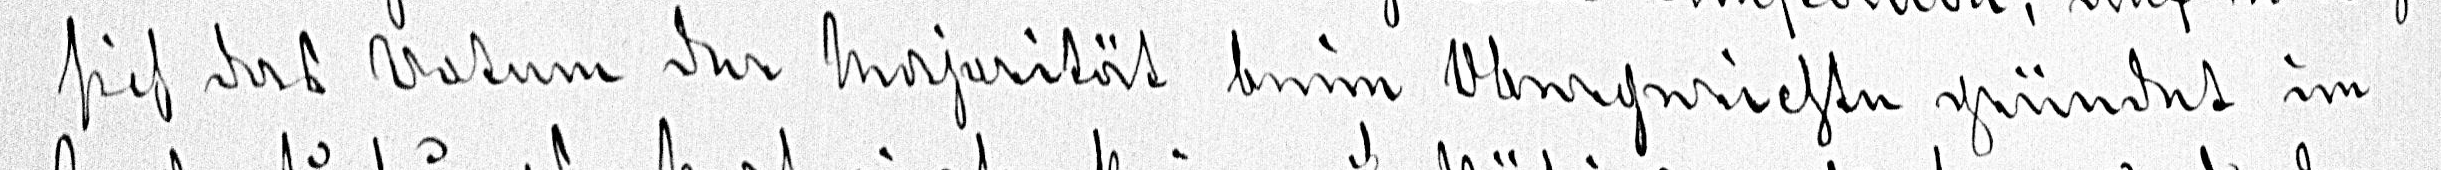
sich das Votum der Majorität beim Obergerichte gründet im
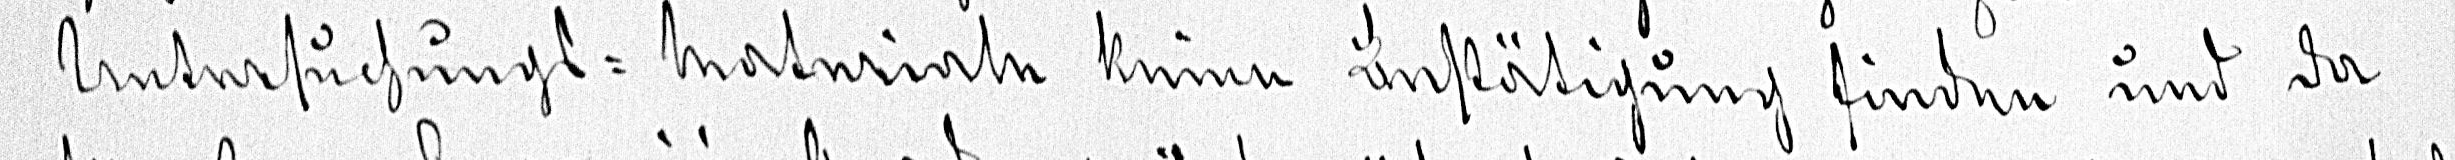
Untersuchungs-Materiale keine Bestätigung finden und da
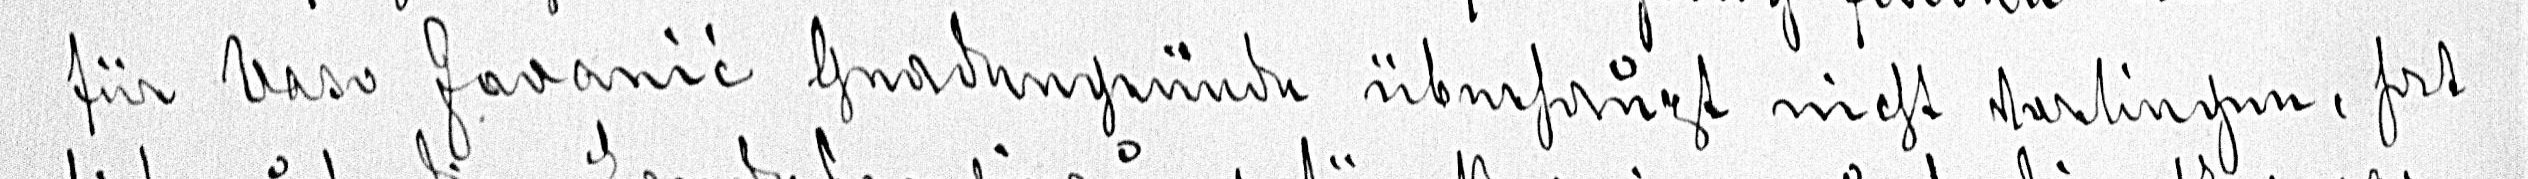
für Vaso Jovanić Gnadengründe überhaupt nicht vorliegen, hat
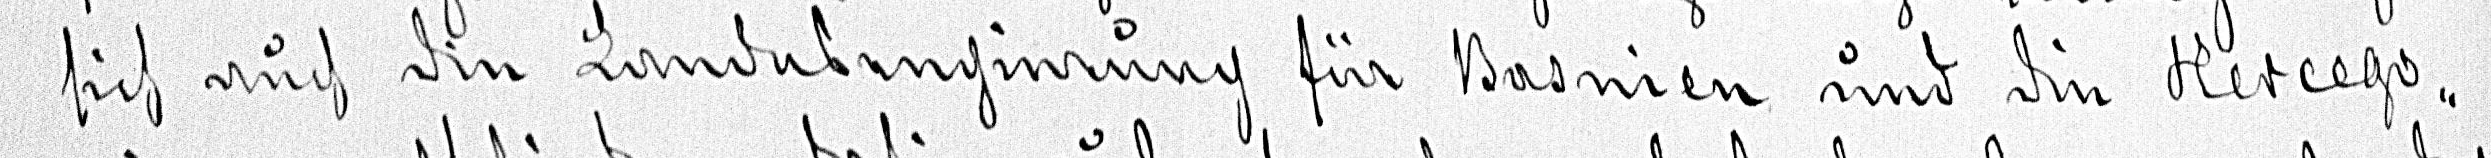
sich auch die Landesregierung für Baosnien und die Hercego¬
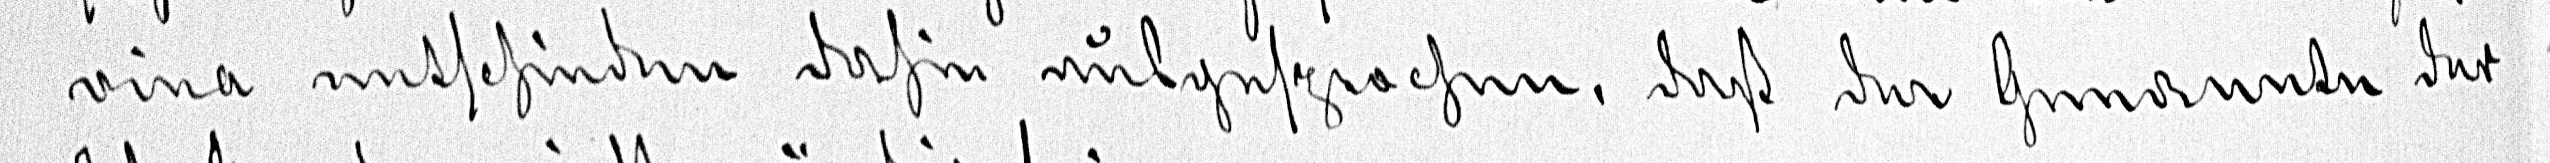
vina entschieden dahin ausgesprochen, daß der Genannte der
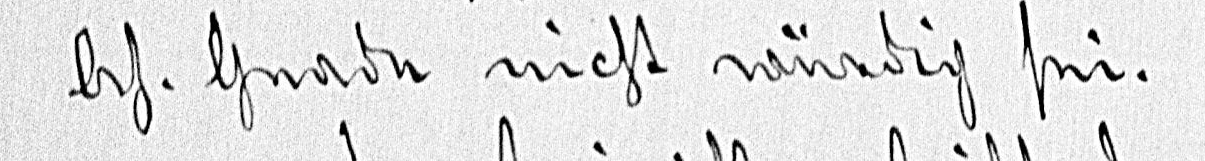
Ah. Gnade nicht würdig sei.
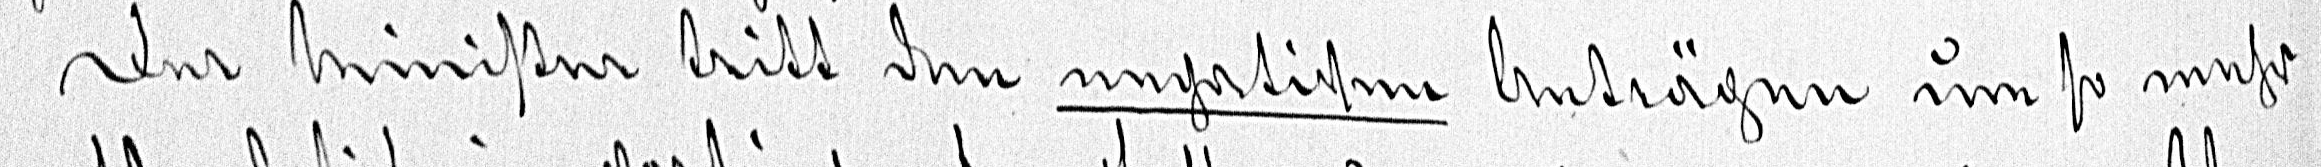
Der Minister tritt den negativen Anträgen um so mehr
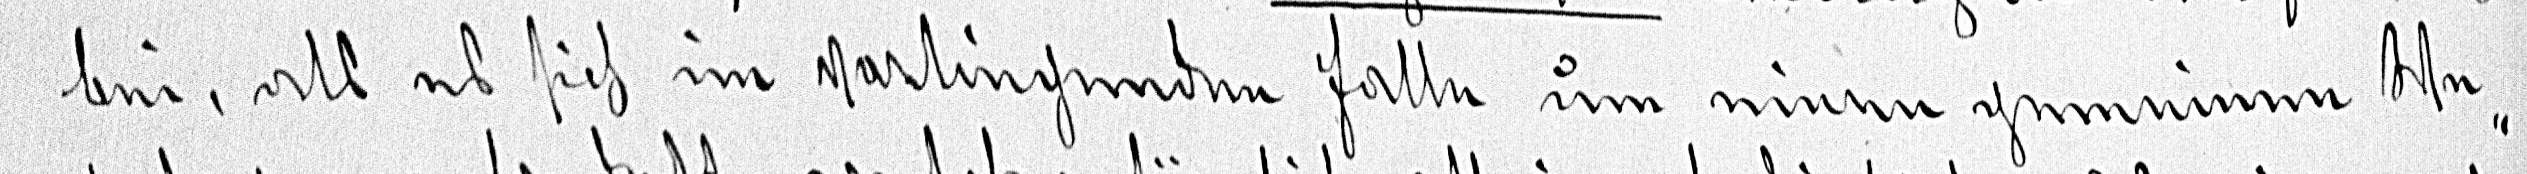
bei, als es sich im vorliegenden Falle um einen gemeinen We¬
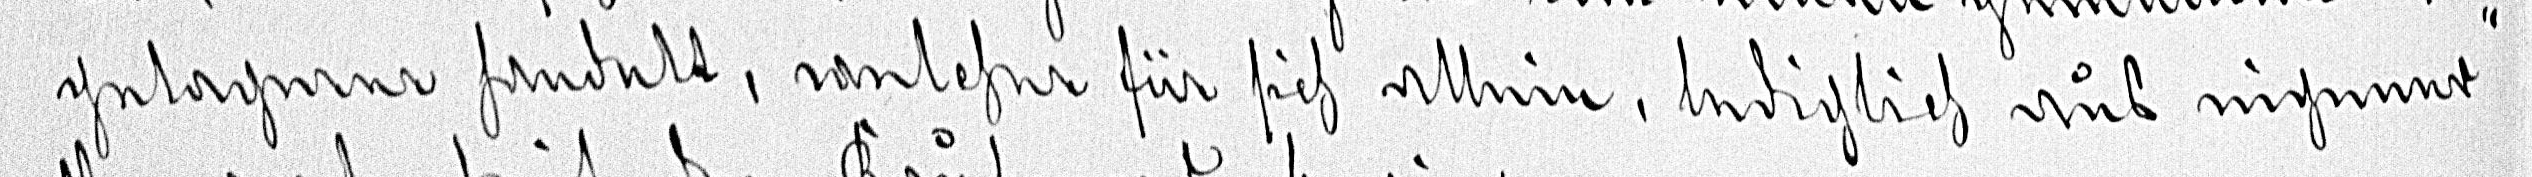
gelagerer handelt, welcher für sich allein, lediglich aus eigener
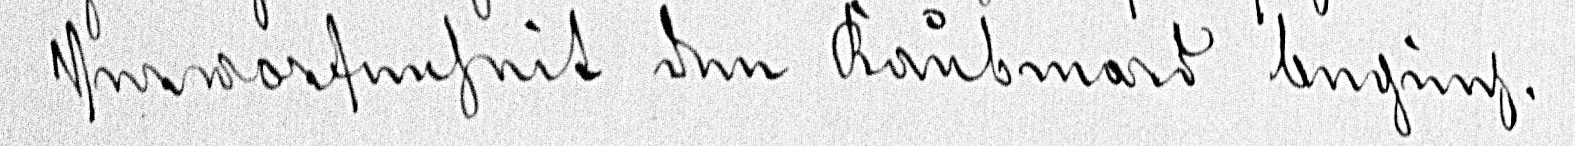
Verworfenheit den Raubmord beging.
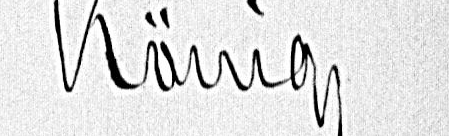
König
